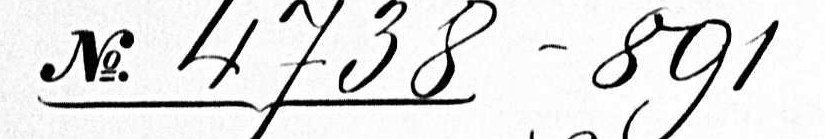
No. 4738 - 1891
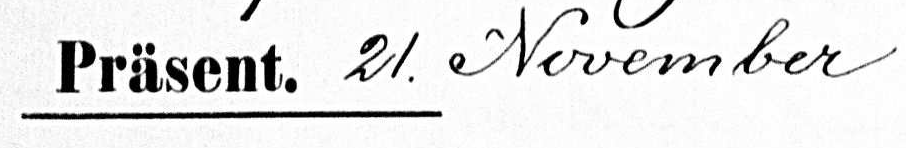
Präsent. 21. November
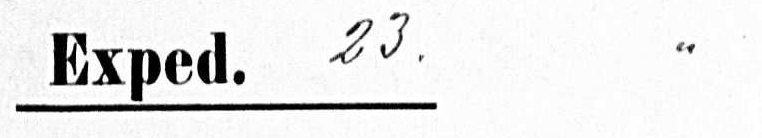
Exped. 13. „
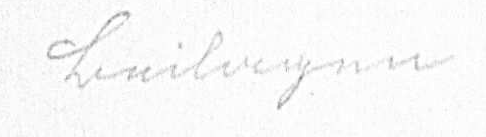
Beilagen
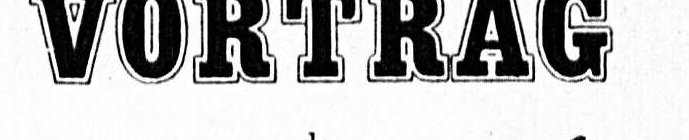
VORTRAG
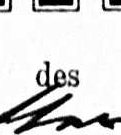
des
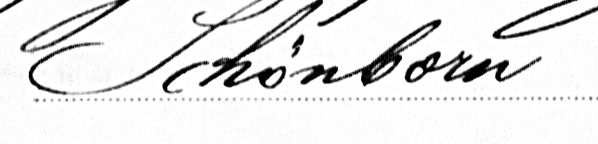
Schönborn
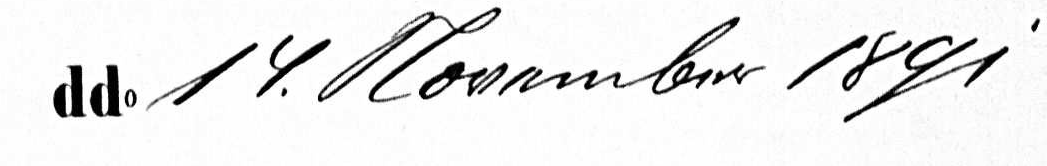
ddo 14. November 1891
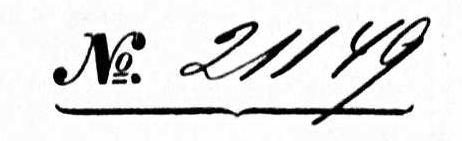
No. 21149
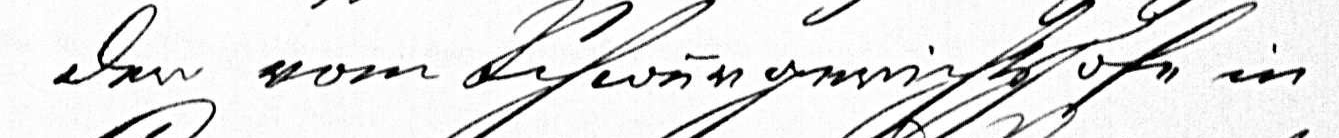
der vom Schwurgerichtshofe in
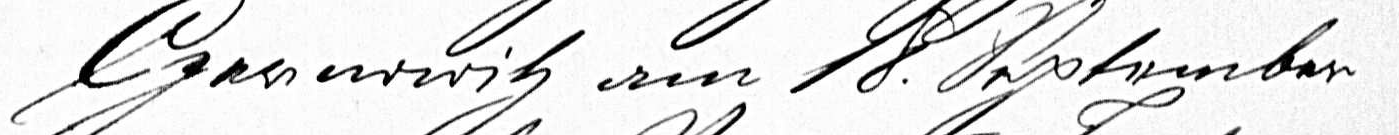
Czernowitz am 18. September
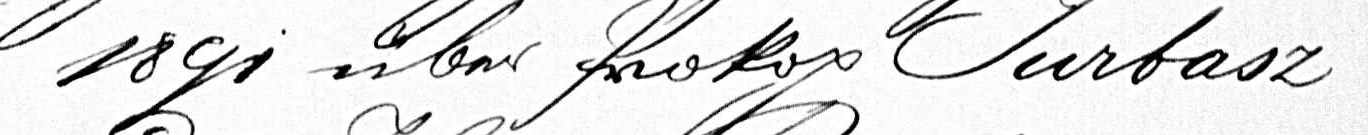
1891 über Prokop Iurbasz
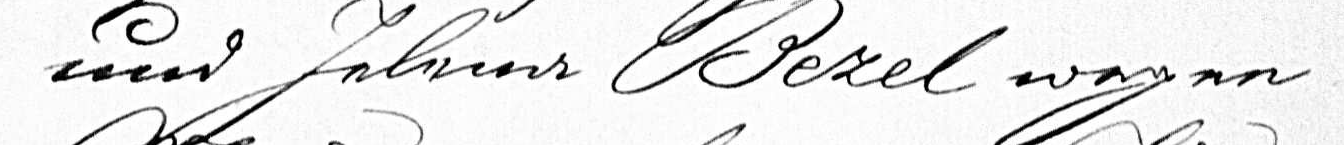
und Jelena Bezel wegen
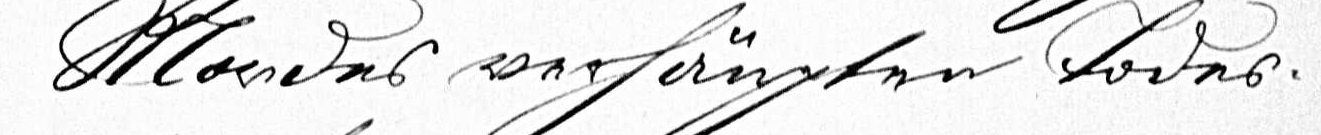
Mordes verhängten Todes¬
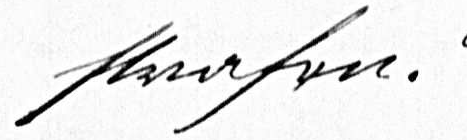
strafe.
